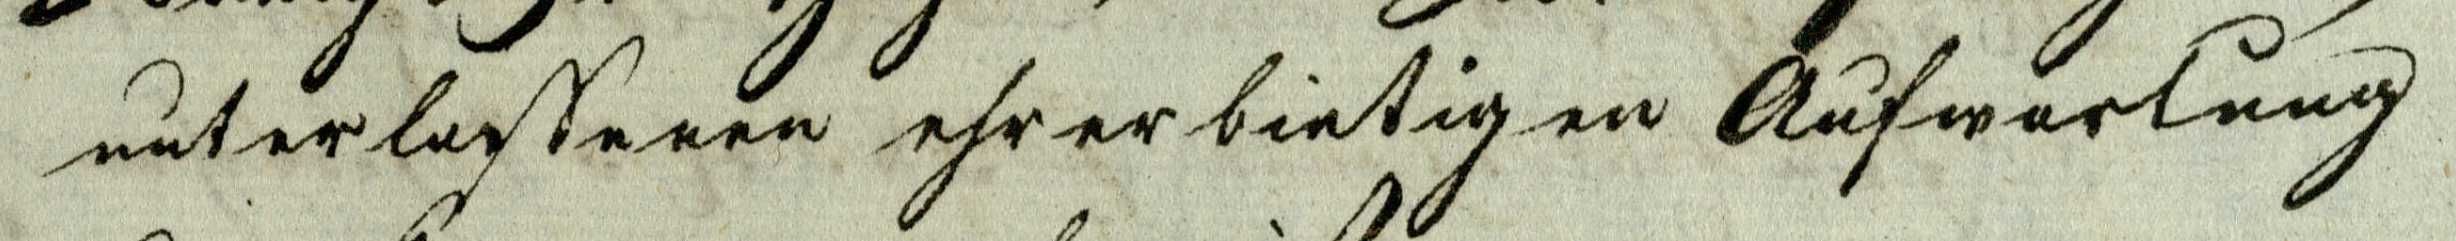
unterlassenen ehrerbietigen Aufwartung
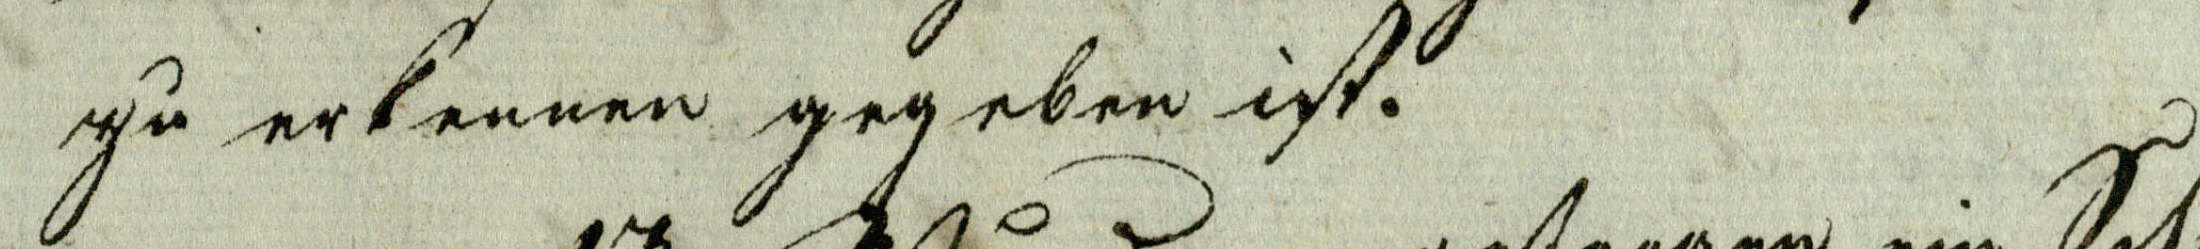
zu erkennen gegeben ist.
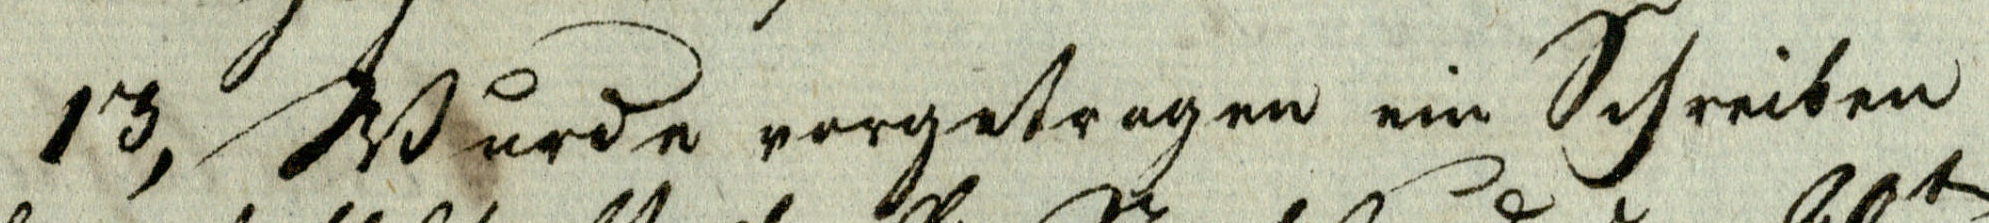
13, Wurde vorgetragen ein Schreiben
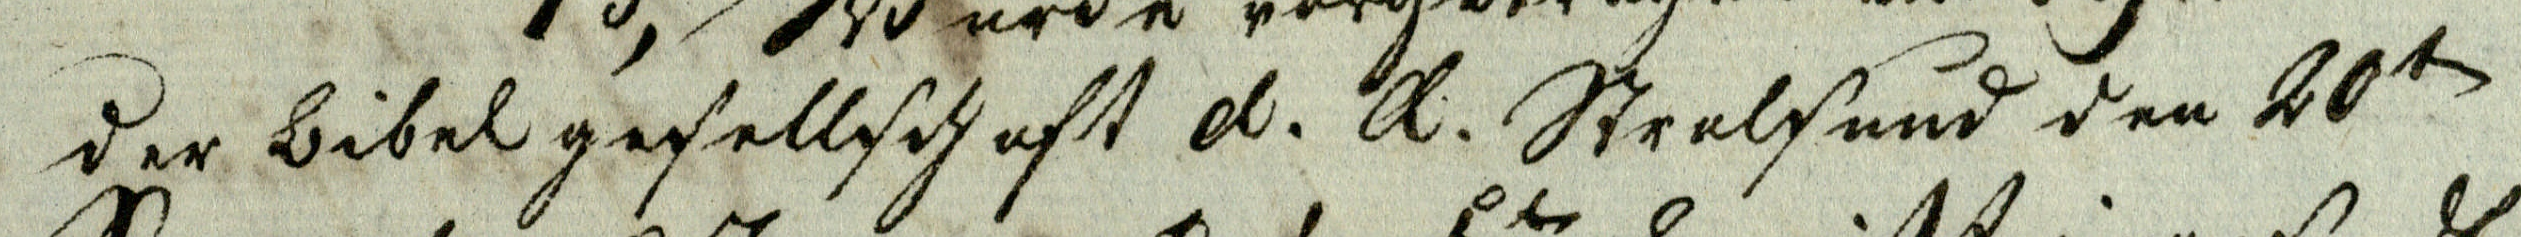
der Bibelgesellschaft d. d. Stralsund den 20ten
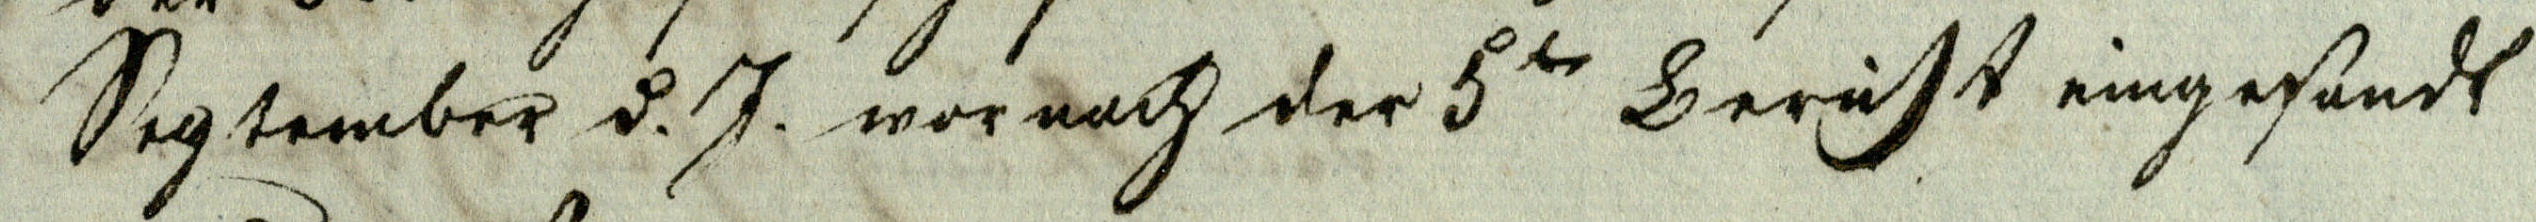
September d. J. wornach der 5te Bericht eingesandt
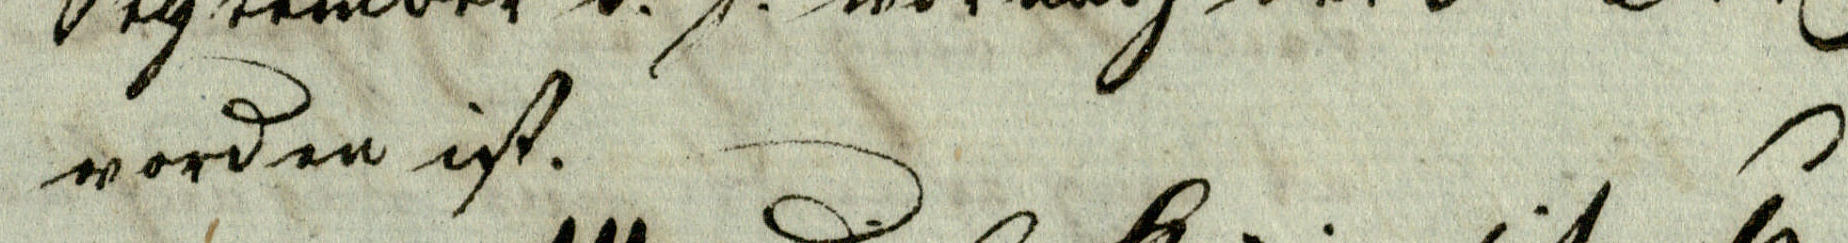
worden ist.
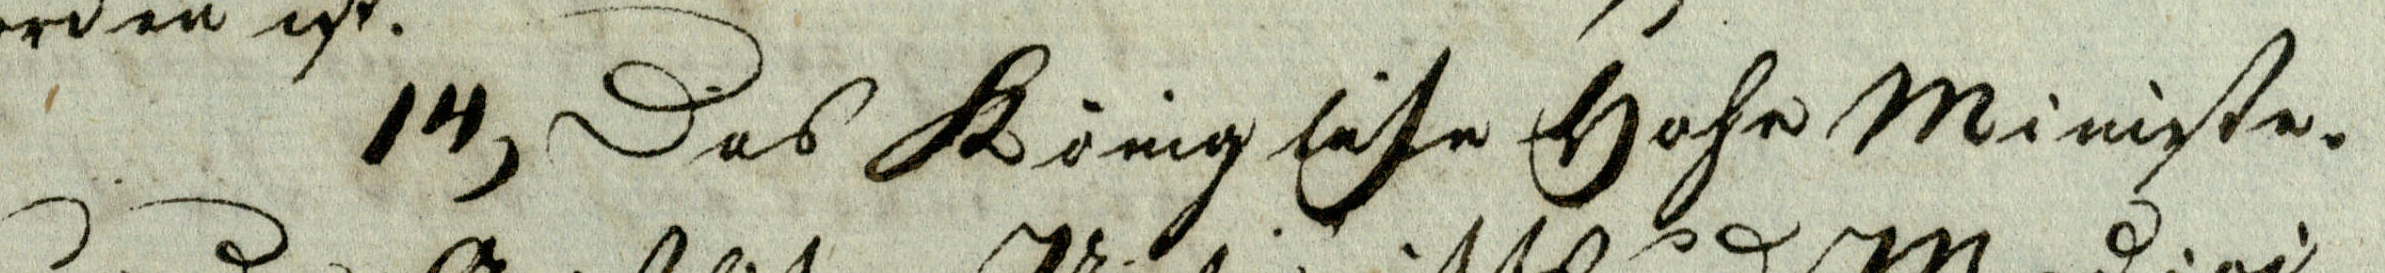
14, das Königliche Hohe Ministe¬
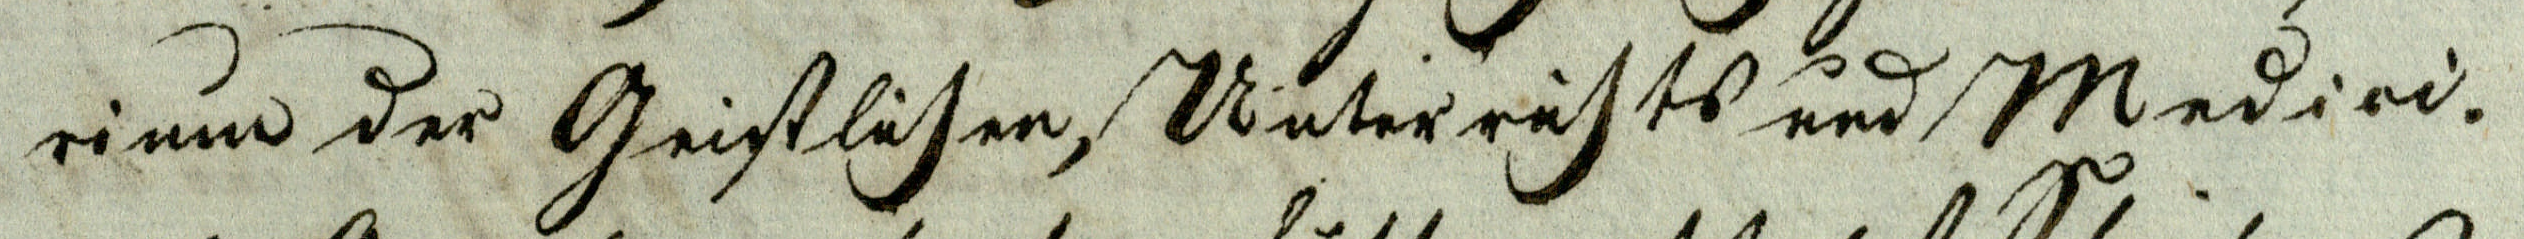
rium der Geistlichen, Unterrichts und Medici¬
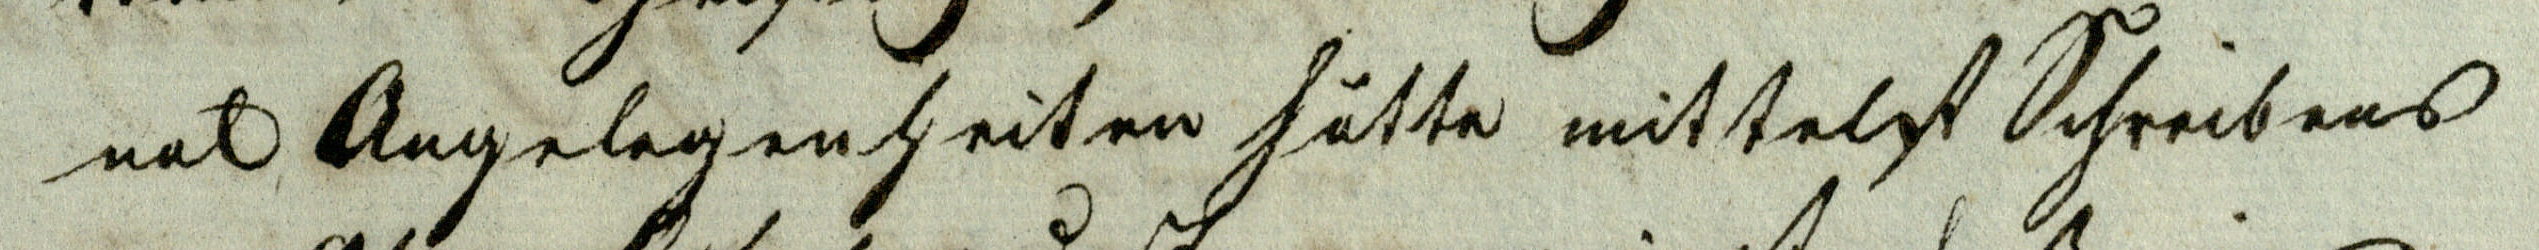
nal Angelegenheiten hätte mittelst Schreibens
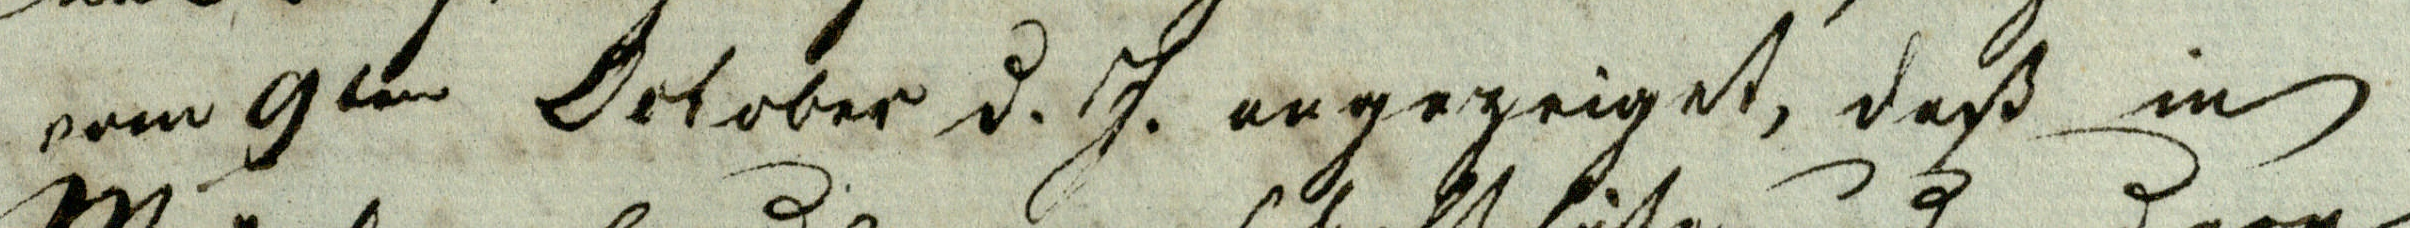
vom 9ten October d. J. angezeiget, daß in
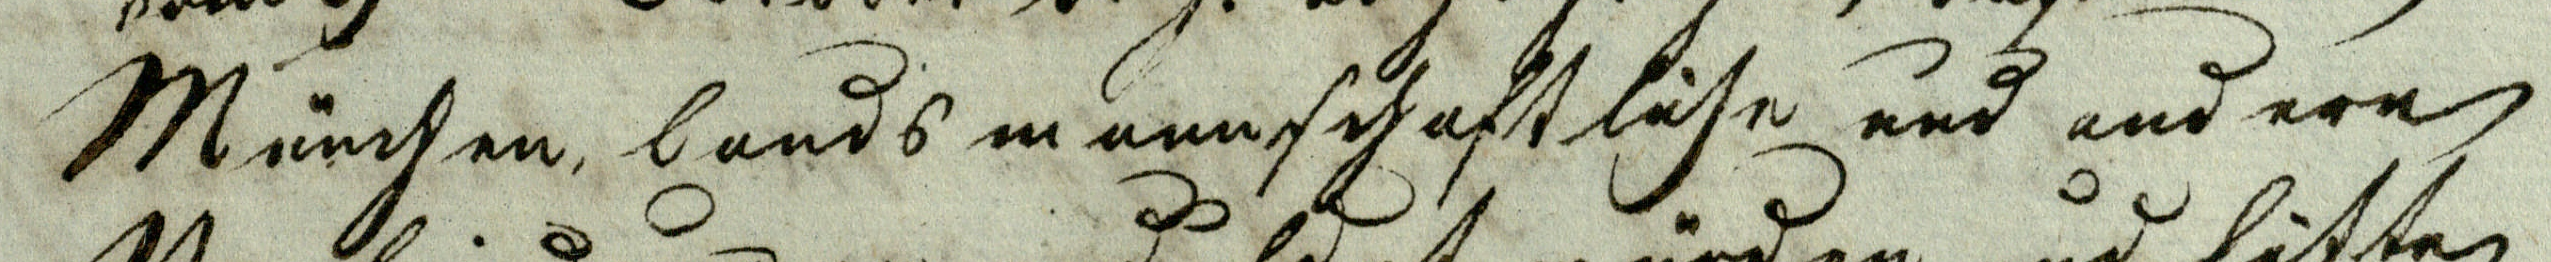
München landsmannschaftliche und andere
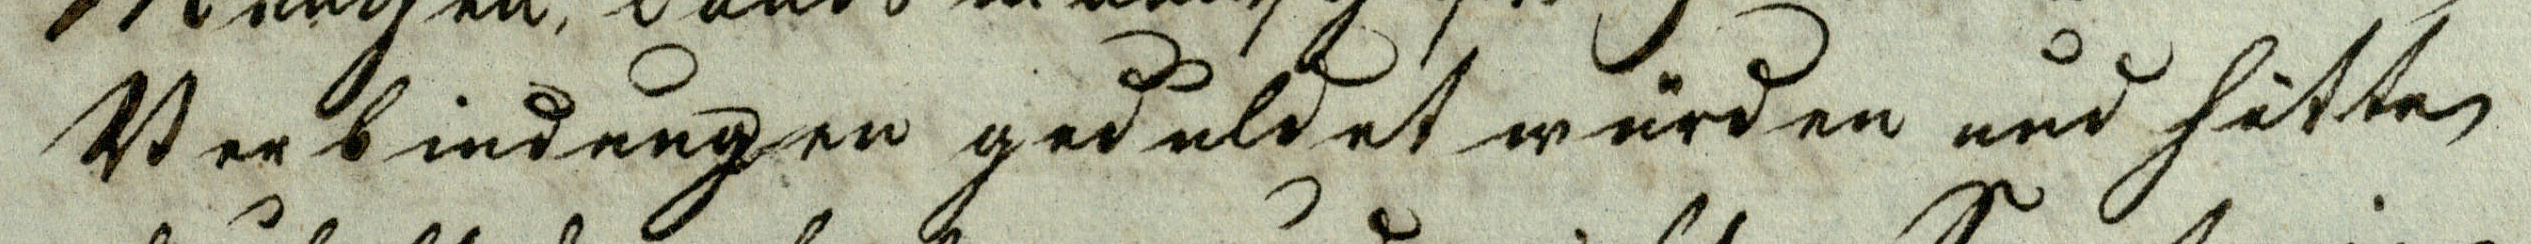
Verbindungen geduldet würden und hätte
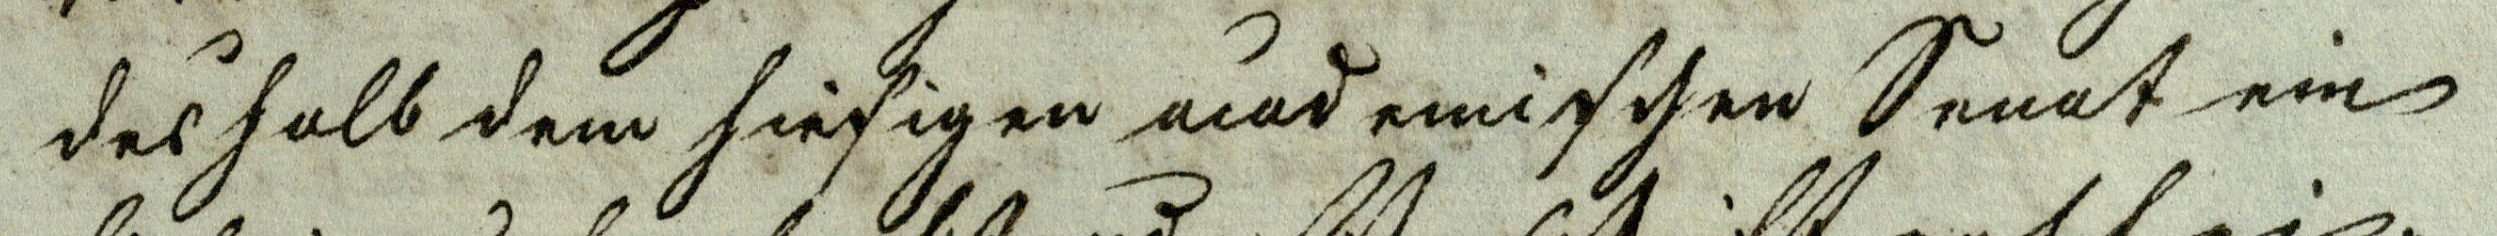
deshalb dem hiesigen academischen Senat ein
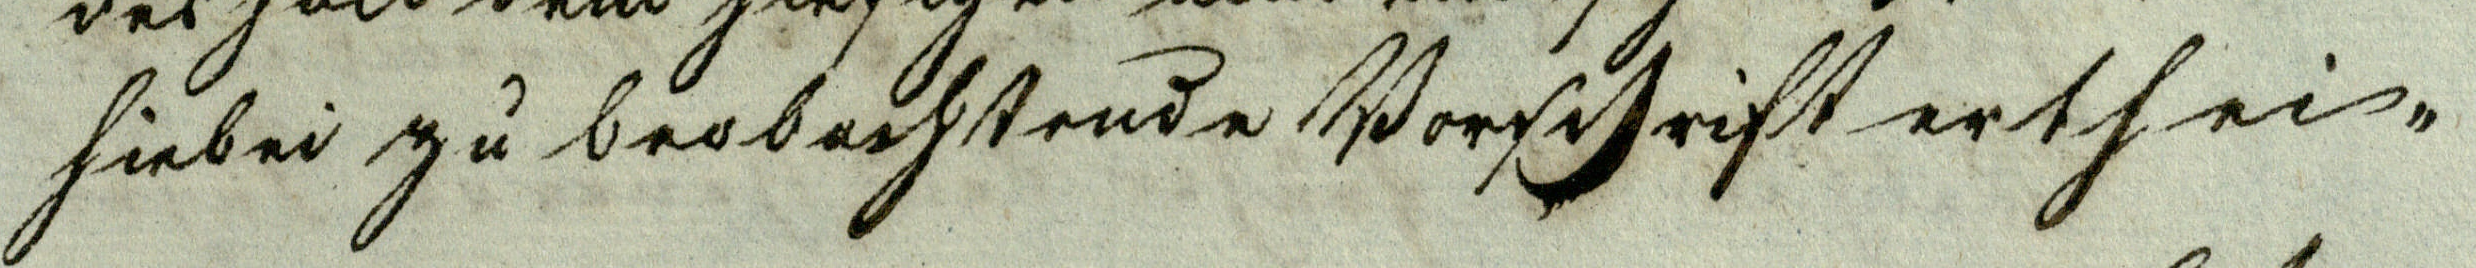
hiebei zu beobachtende Vorschrift erthei¬
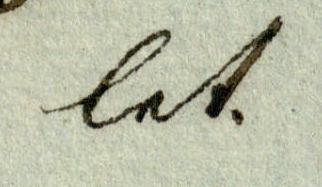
let.
